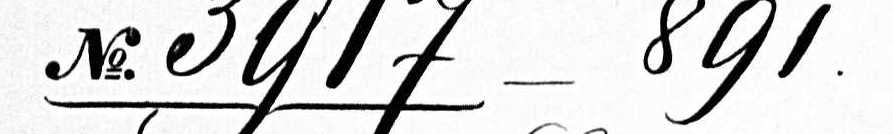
No. 3917 - 1891
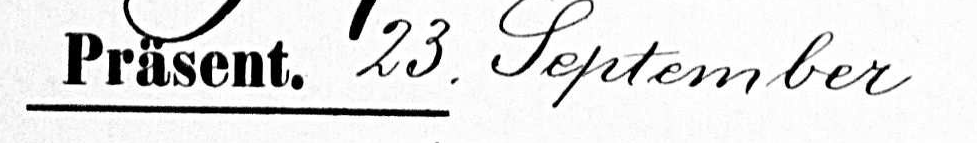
Präsent. 23. September
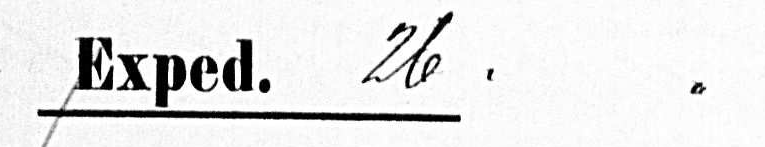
Exped. 26. „
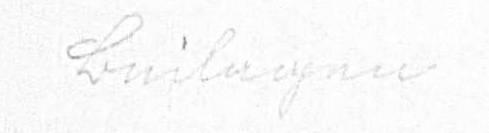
Beilagen
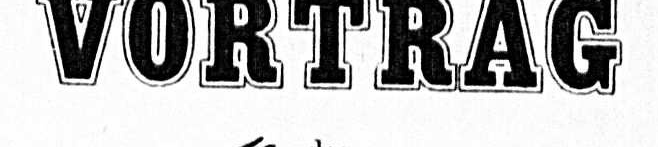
VORTRAG
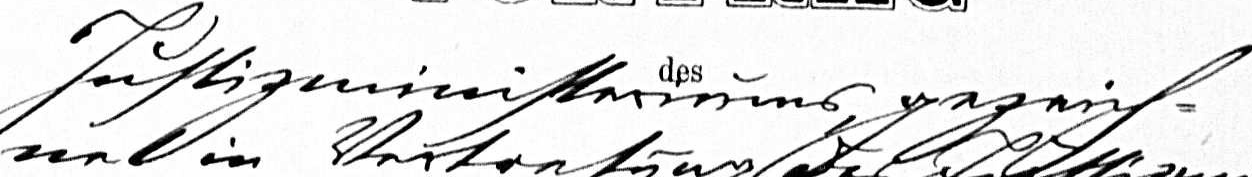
des
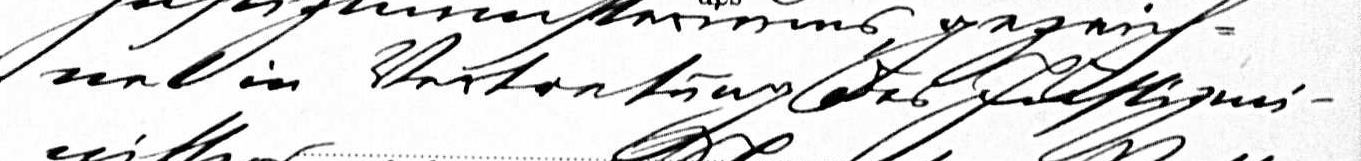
net in Vertretung des Justizmi¬
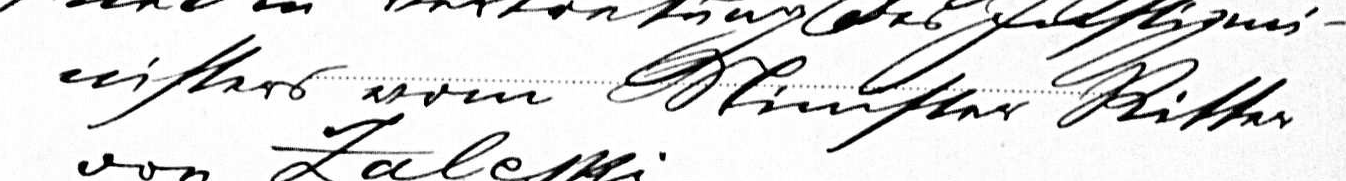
nisters vom Minister Ritter
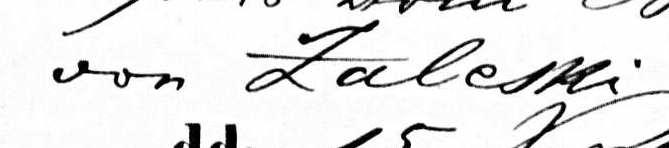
von Zaleski
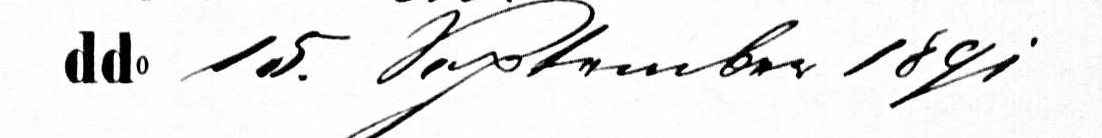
ddo 15. September 1891
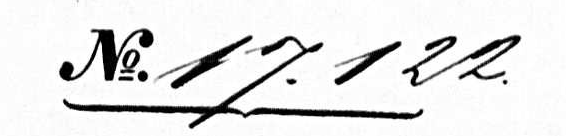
No. 17122
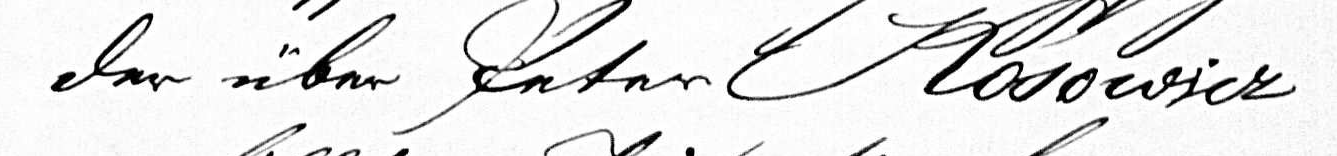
der über Peter Kosowicz
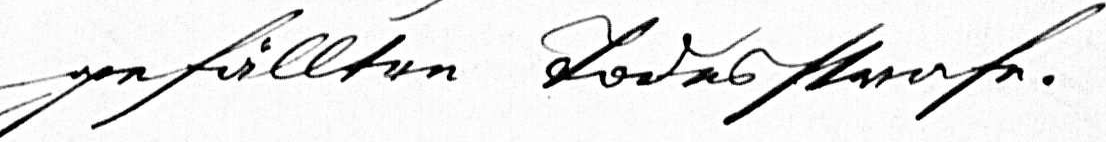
gefällten Todesstrafe.
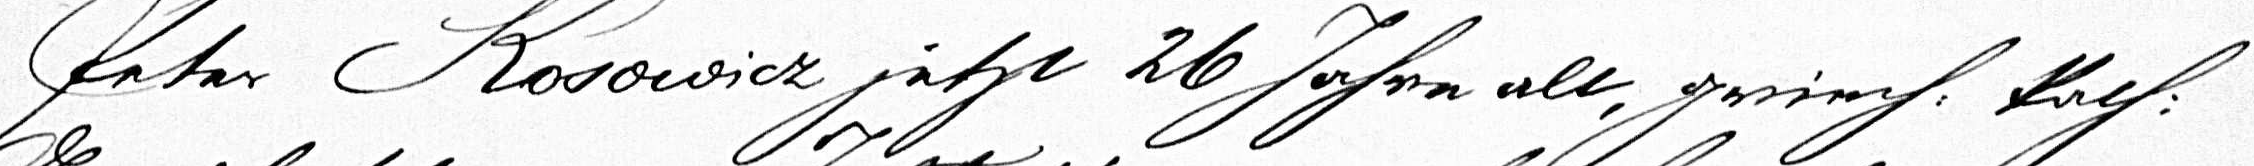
Peter Kosowicz jetzt 26 Jahre alt, griech. Kath.
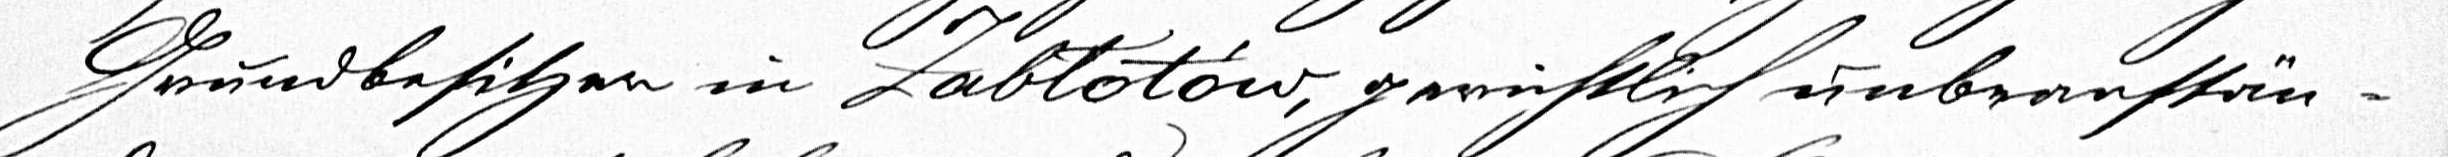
Grundbesitzer in Zabłotów, gerichtlich unbeanstän¬
